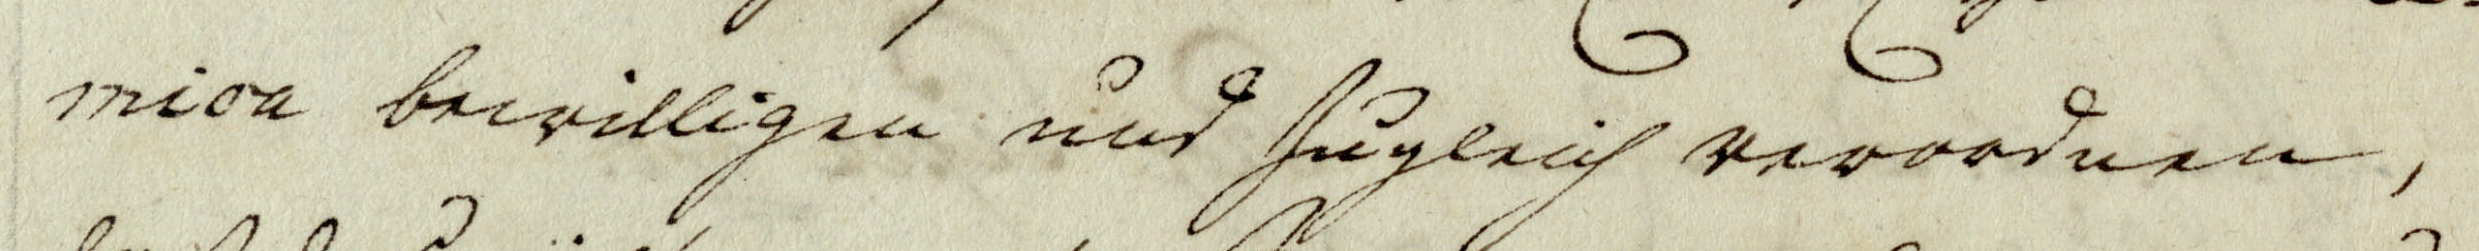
mica bewilligen und zugleich verordnen,
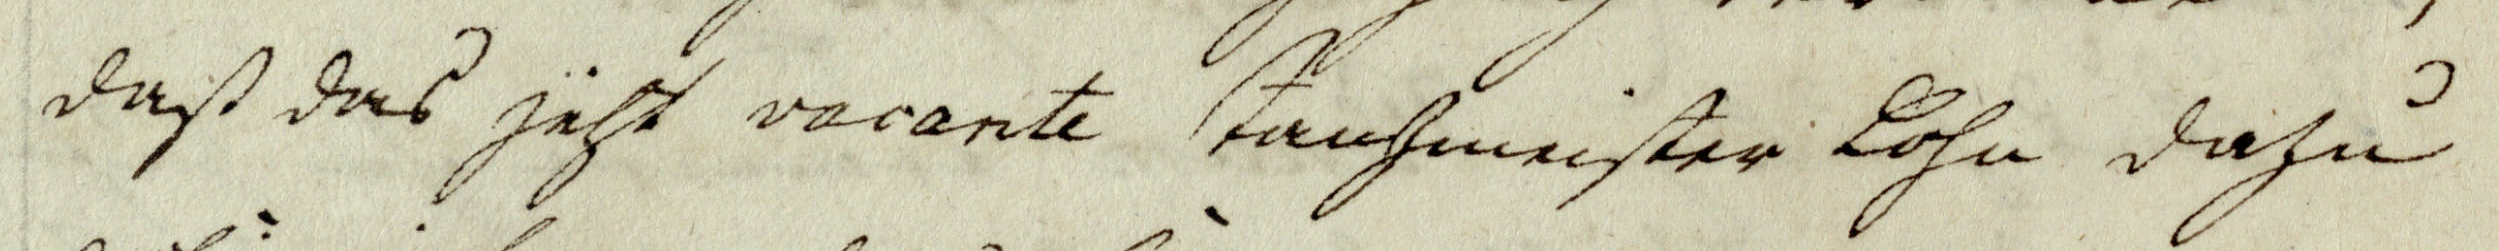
daß das jetzt vacante Tanzmeister Lohn dazu
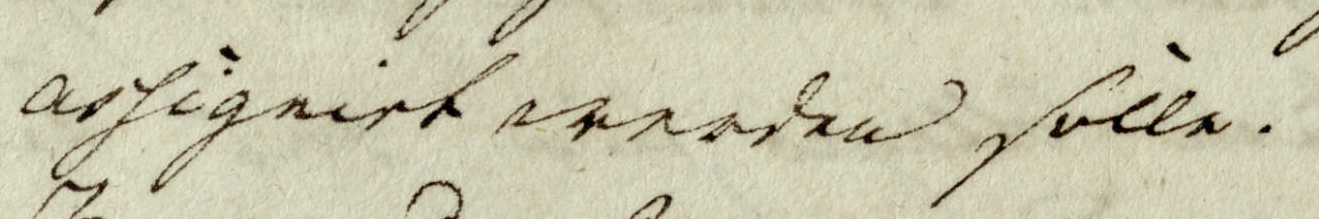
assignirt werden solle.
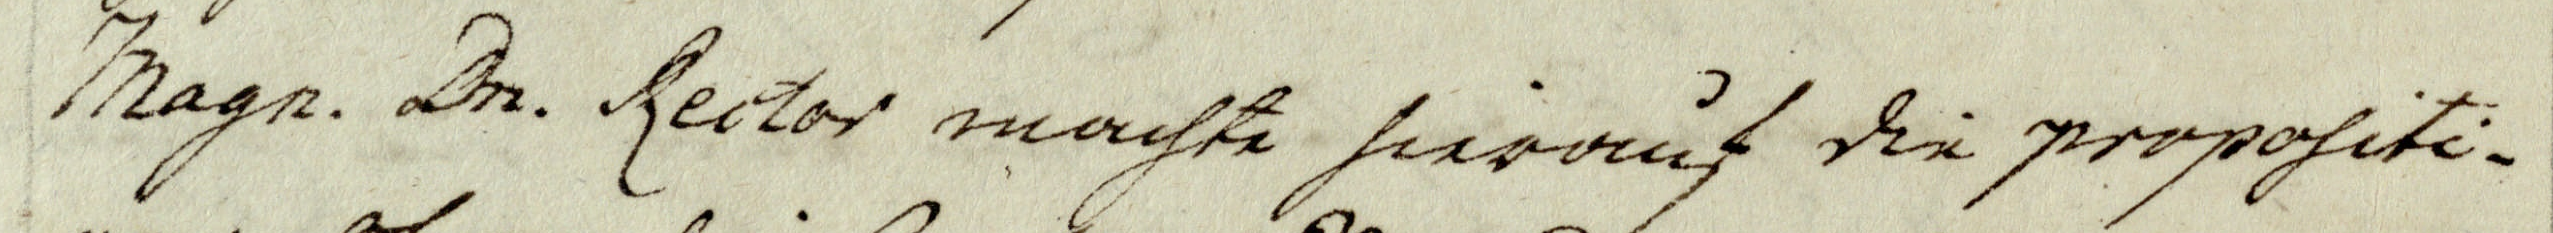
Magn. Dn. Rector machte hierauf die propositi¬
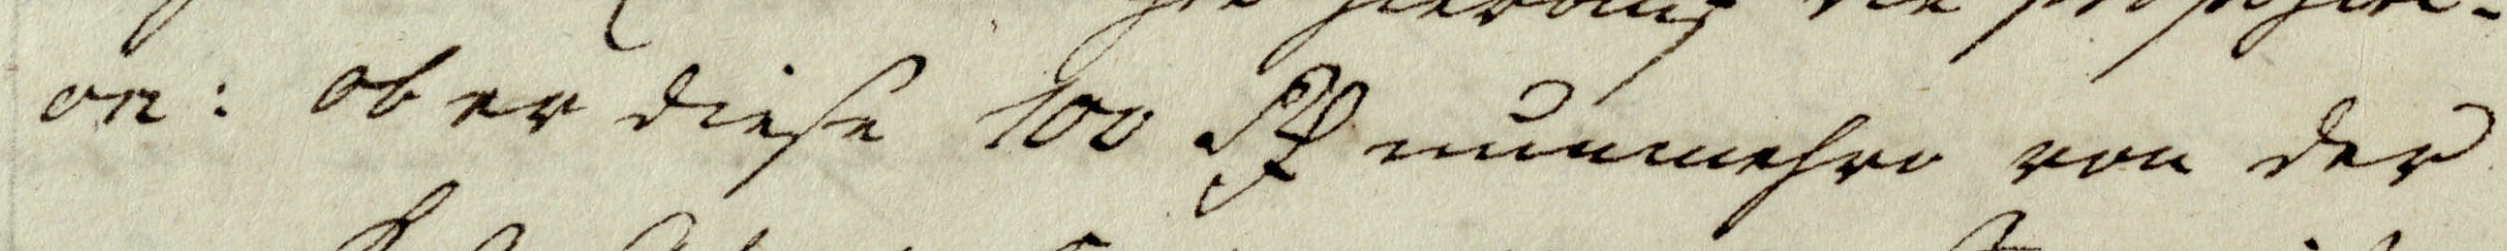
on: ob er diese 100 rtl. nunmehr von der
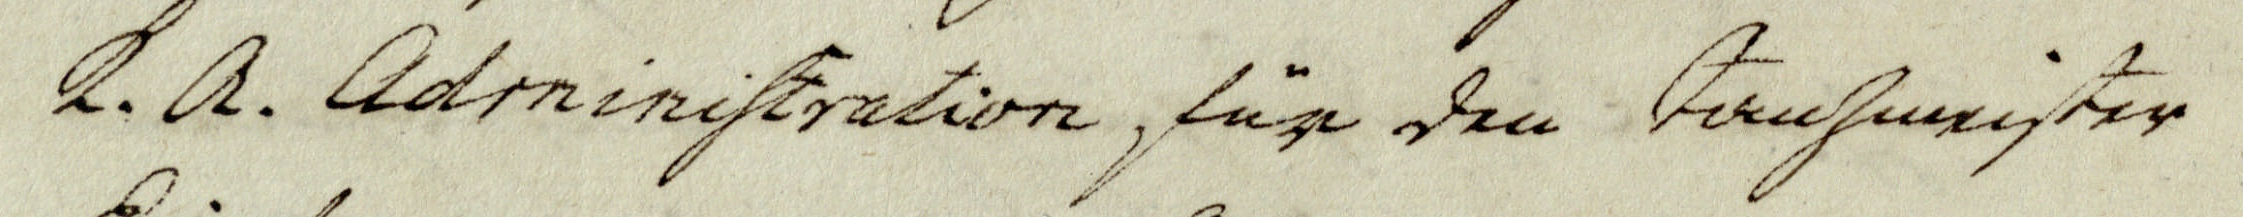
K. A. Administration für den Tanzmeister
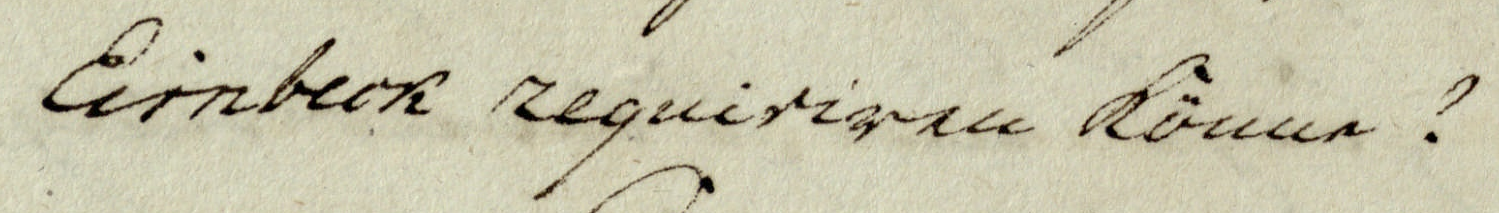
Eimbeck requiriren könne?
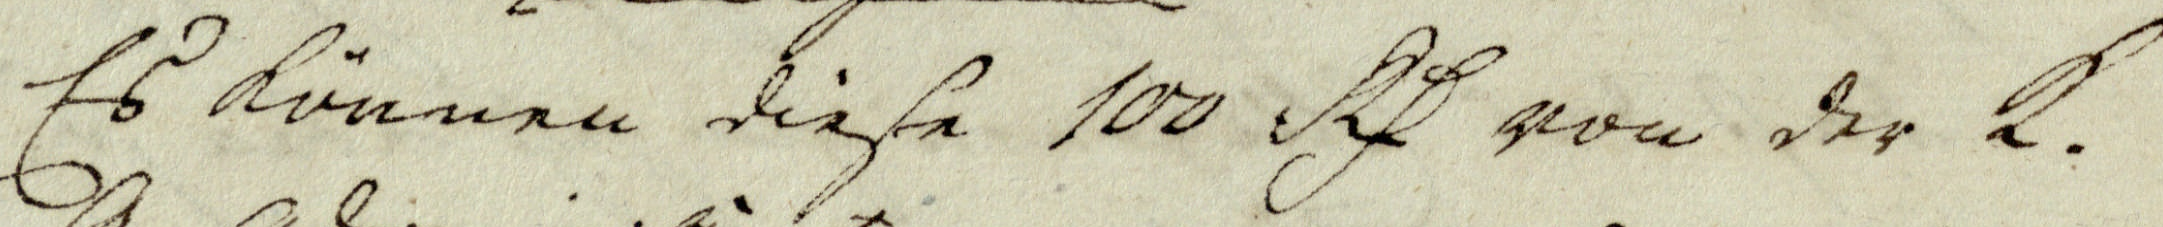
Es können diese 100 rtl. von der K.
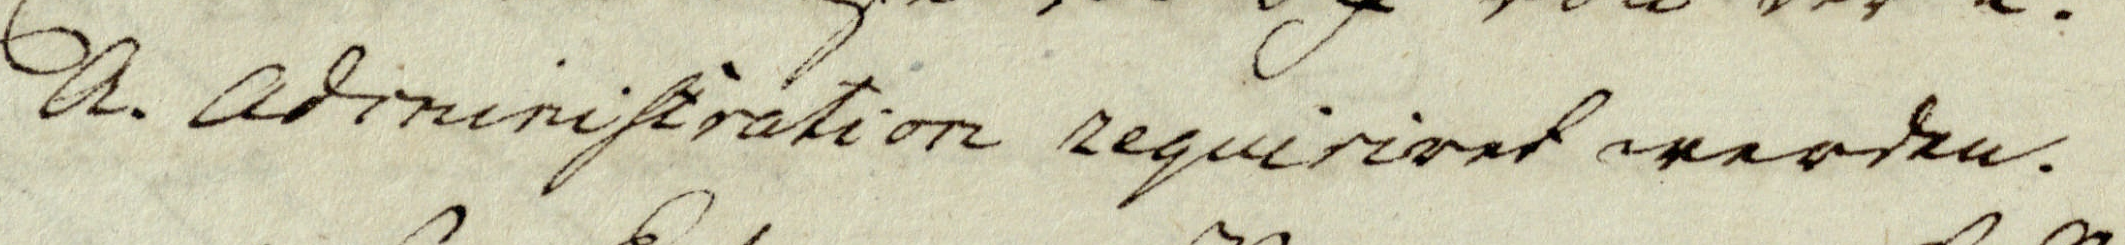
A. Administration requirirt werden.
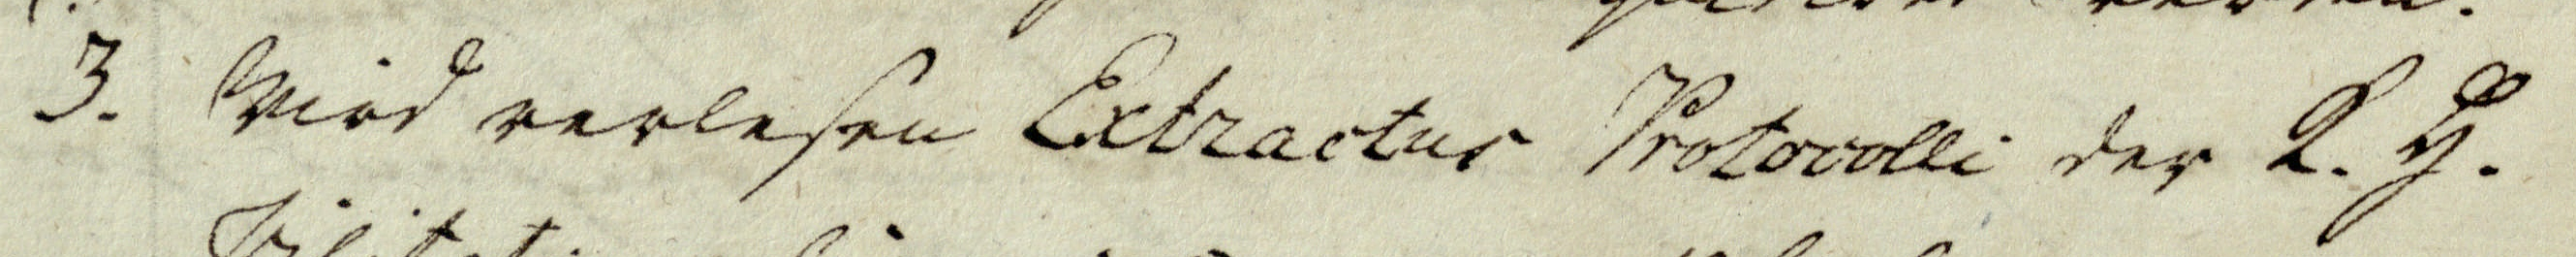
3. Wird verlesen Extractus Protocolli der K. H.
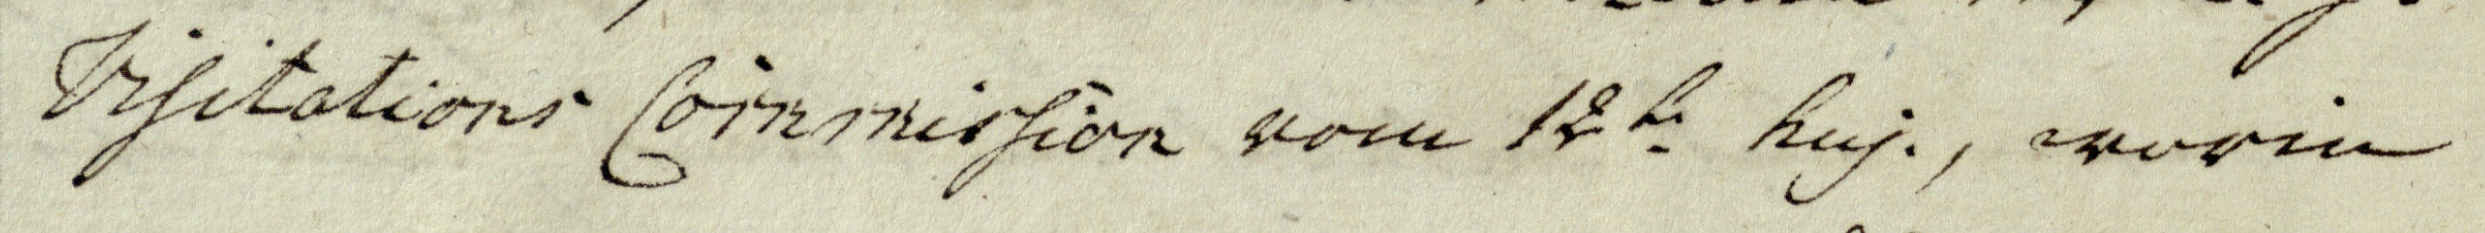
Visitations Commission vom 12ten huj., worin
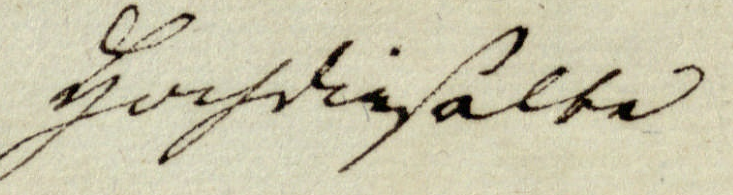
Hochdieselbe
